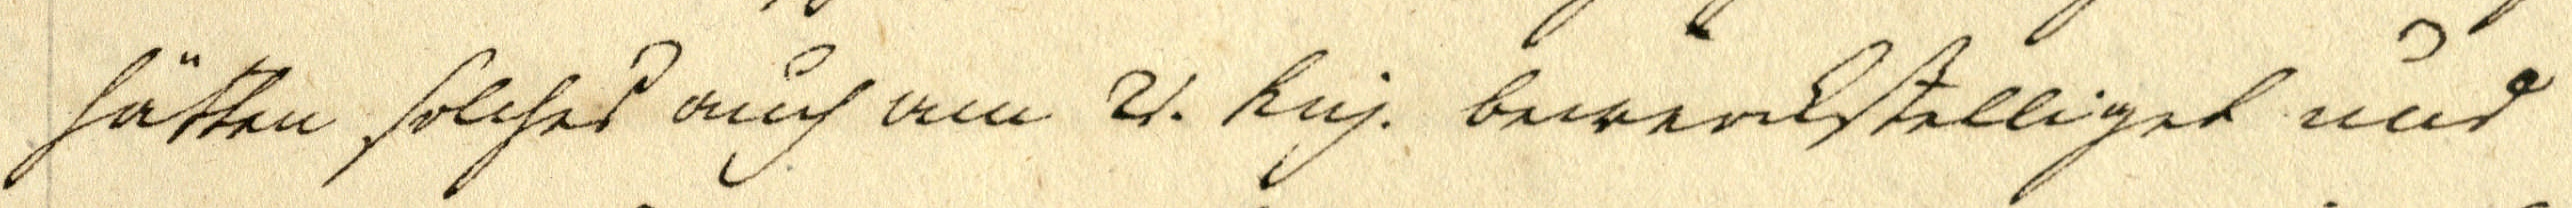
hätten solches auch am 21. huj. bewerckstelliget und
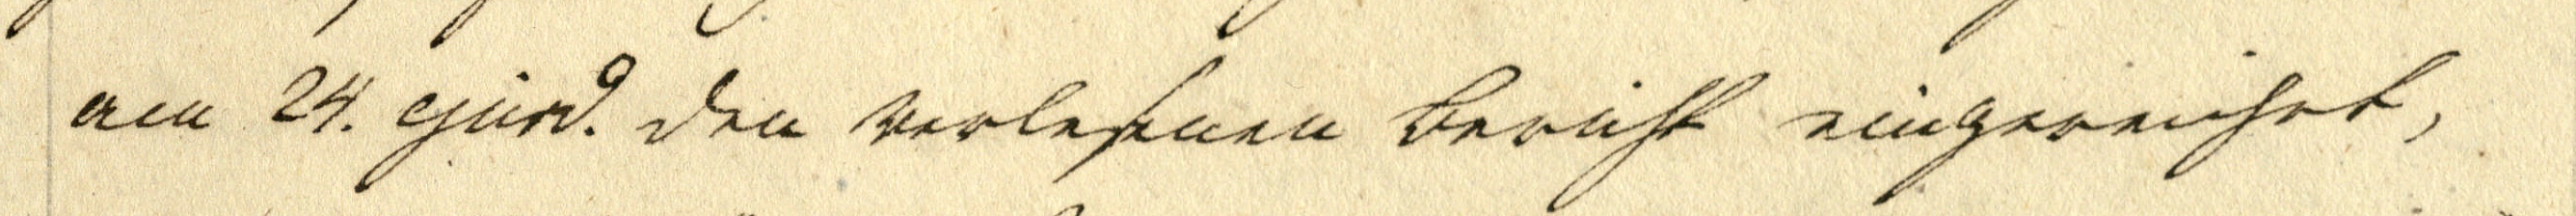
am 24. ejusd. den verlesenen Bericht eigereichet,
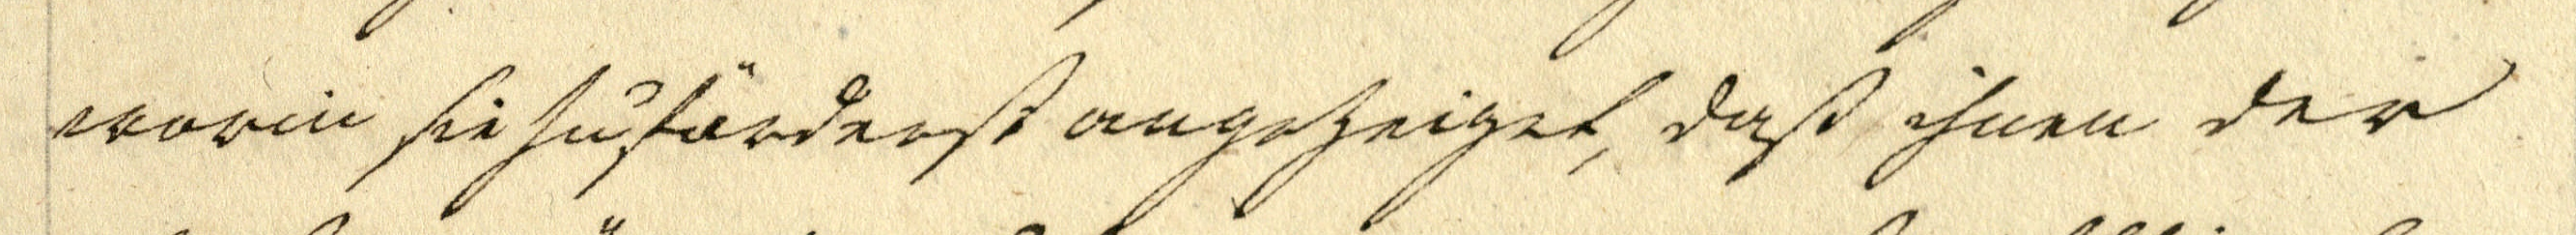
worin sie zu förderst angezeiget, daß ihnen der
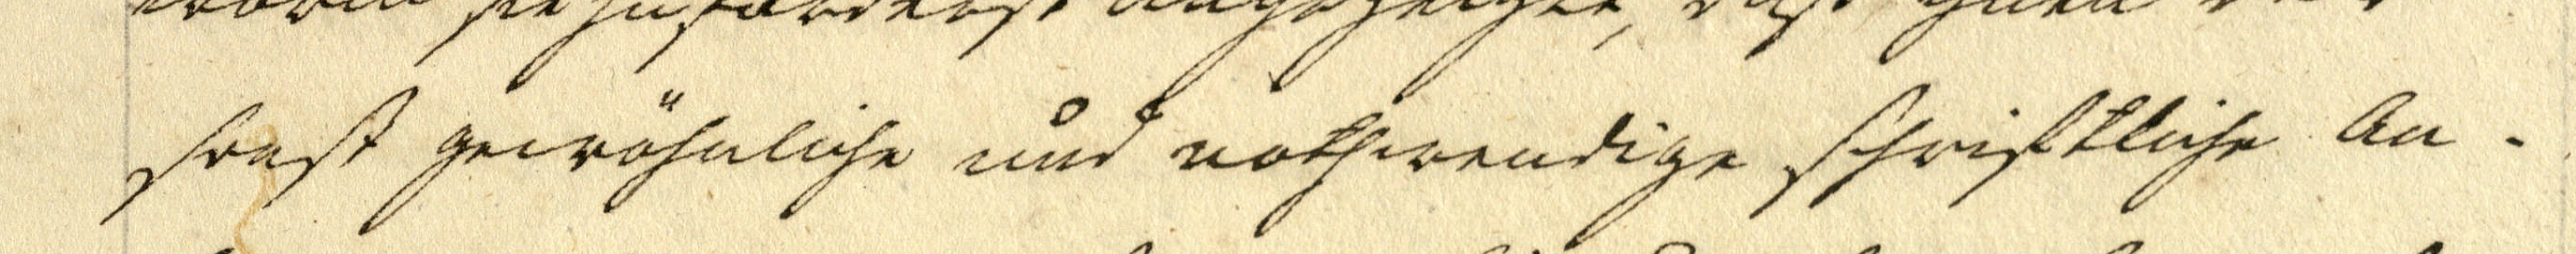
sonst gewöhnliche und nothwendige schriftliche An¬
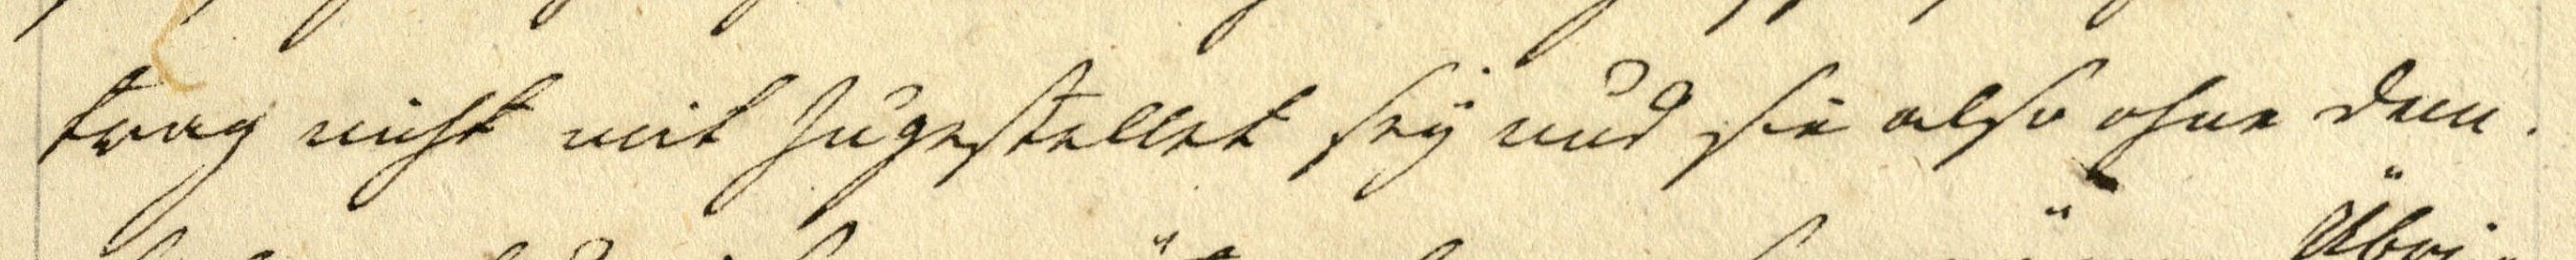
trag nicht mit zugestellet seÿ und sie also ohne dem¬
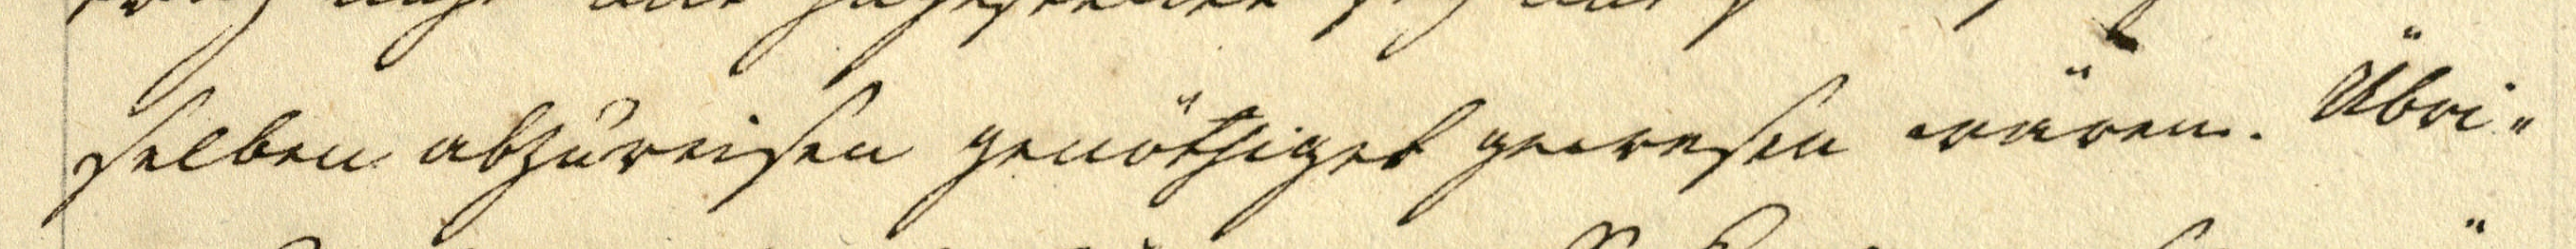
selben abzureisen genöthiget gewesen wären. Übri¬
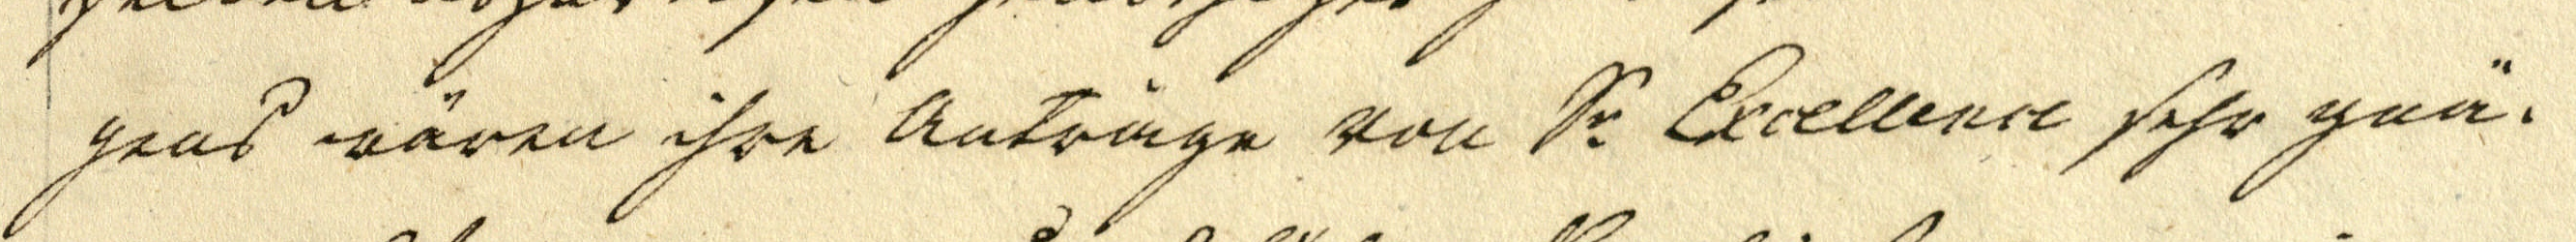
gens wären ihre Anträge von Sr. Excellence sehr gnä¬
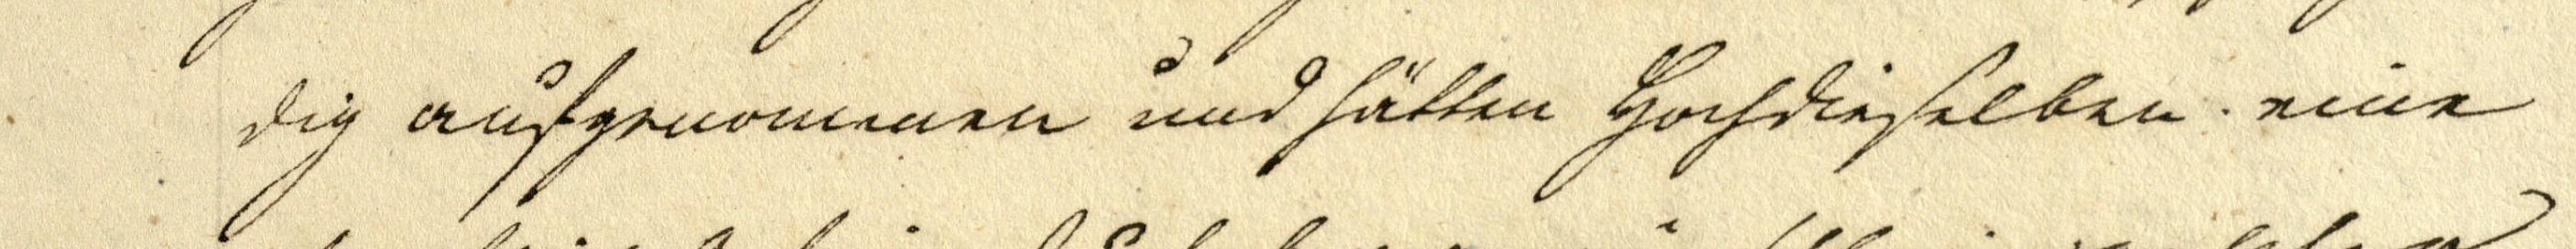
dig aufgenommen und hätten Hochdieselben eine
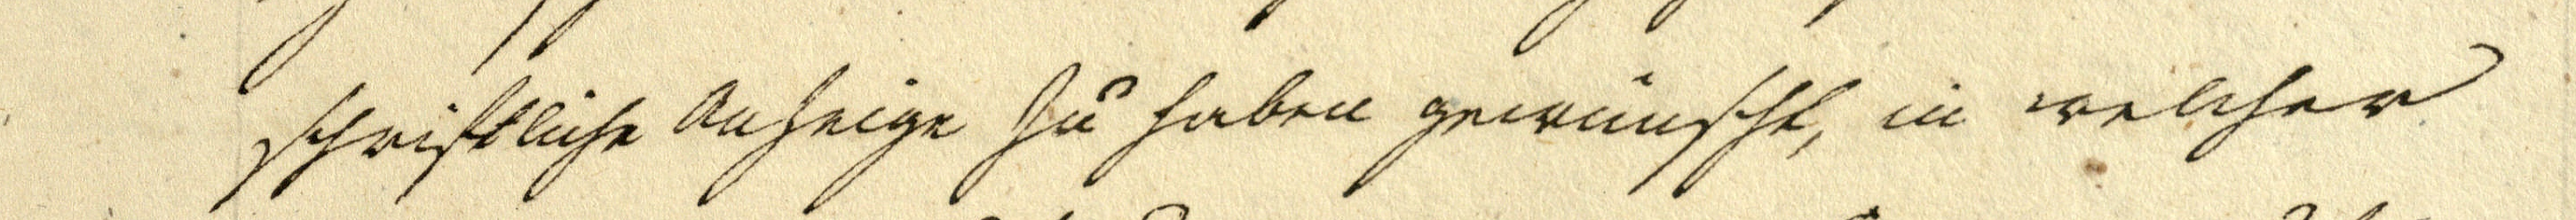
schriftliche Anzeige zu haben gewünscht, in welcher
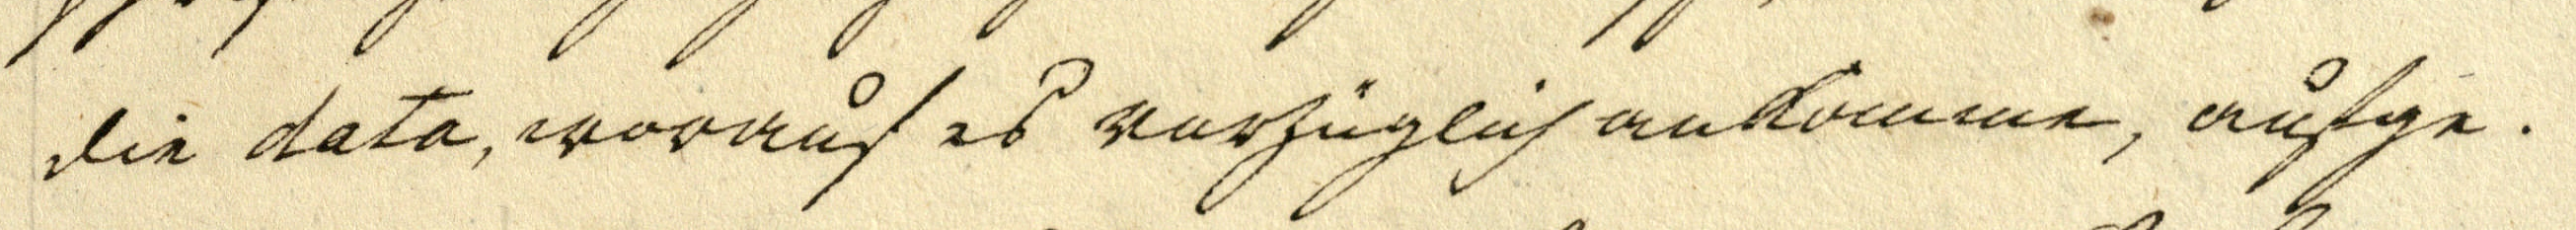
die data, worauf es vorzüglich ankomme, aufge¬
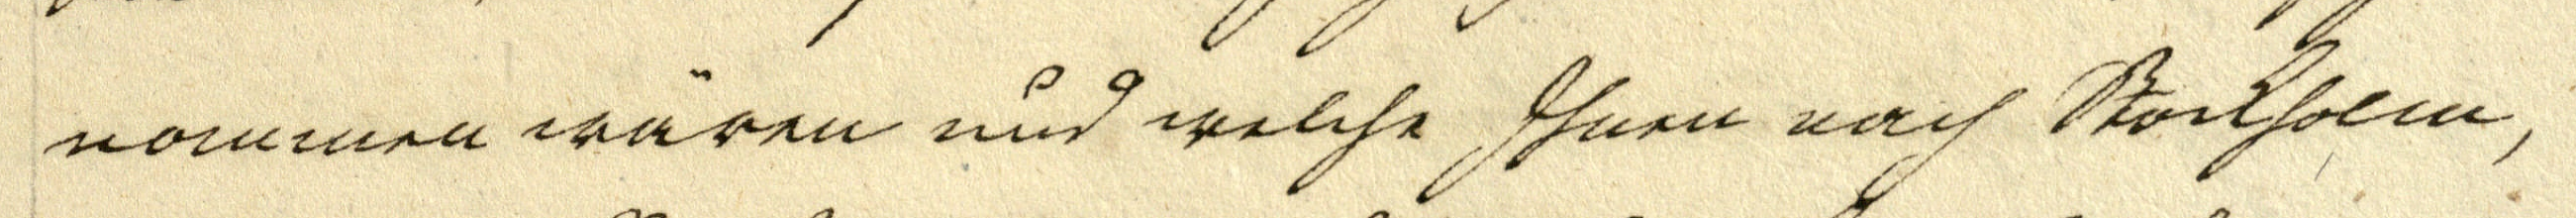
nommen wären und welche Ihnen nach Stockholm,
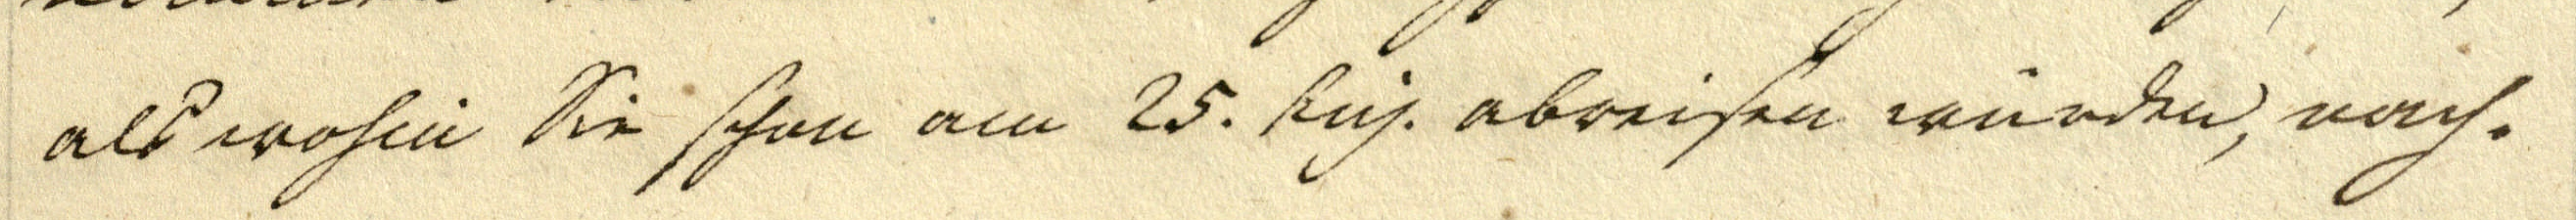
als wohin Sie schon am 25. huj. abreisen würden, nach¬
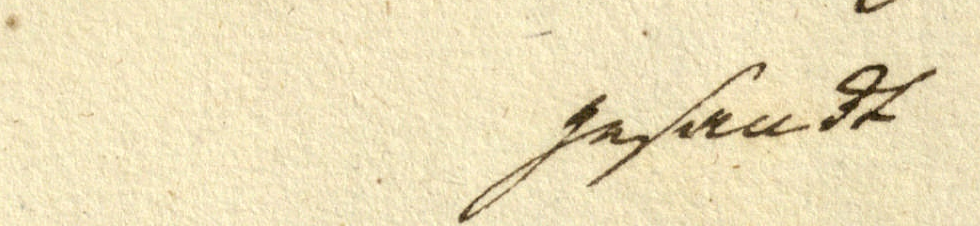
gesandt.
